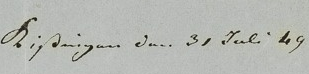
Kißingen den 31 Juli 49
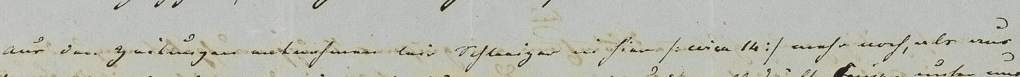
Aus den Zeitungen entnehmen wir Schweizer in hier (circa 14) mehr noch, als aus
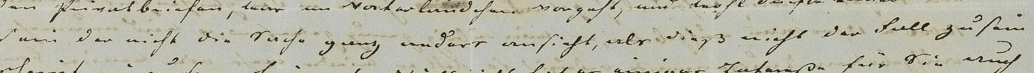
sein der nicht die Sache ganz anders ansieht, als dieß nicht der Fall zu sein
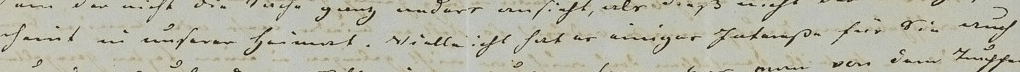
scheint in unserer Heimat. Vielleicht hat es einiges Intereße für Sie auch
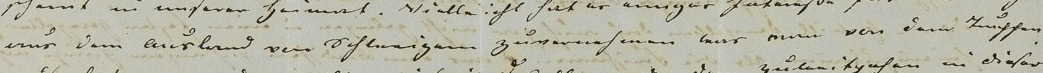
aus dem Ausland von Schweizern zu vernehmen was man von dem Truppen-
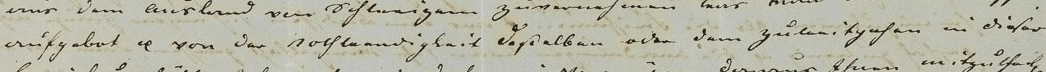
aufgebot u von der Nothwendigkeit deßelben oder dem Zuweitgehen in dieser
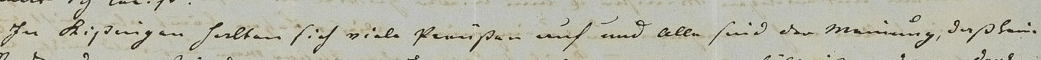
In Kißingen halten sich viele Preußen auf und Alle sind der Meinung, daß keine
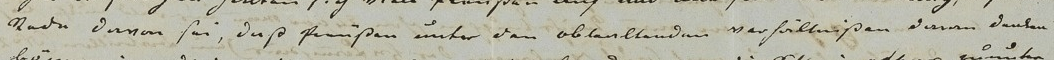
Rede davon sei, daß Preussen unter den obwaltenden Verhältnißen daran denken
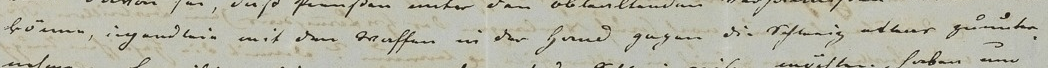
könne, irgendwie mit den Waffen in der Hand gegen die Schweiz etwas zu unter-
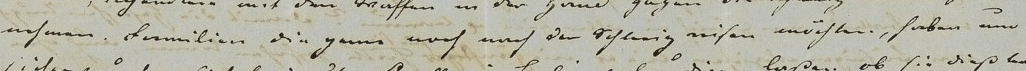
nehmen. Familien die gerne noch nach der Schweiz reisen möchten, haben um
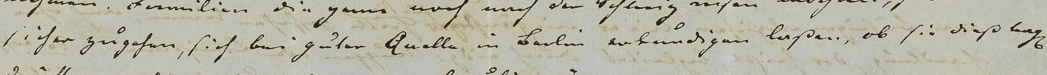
sicher zu gehen, sich bei guter Quelle, in Berlin erkundigen laßen, ob sie dieß wagen
